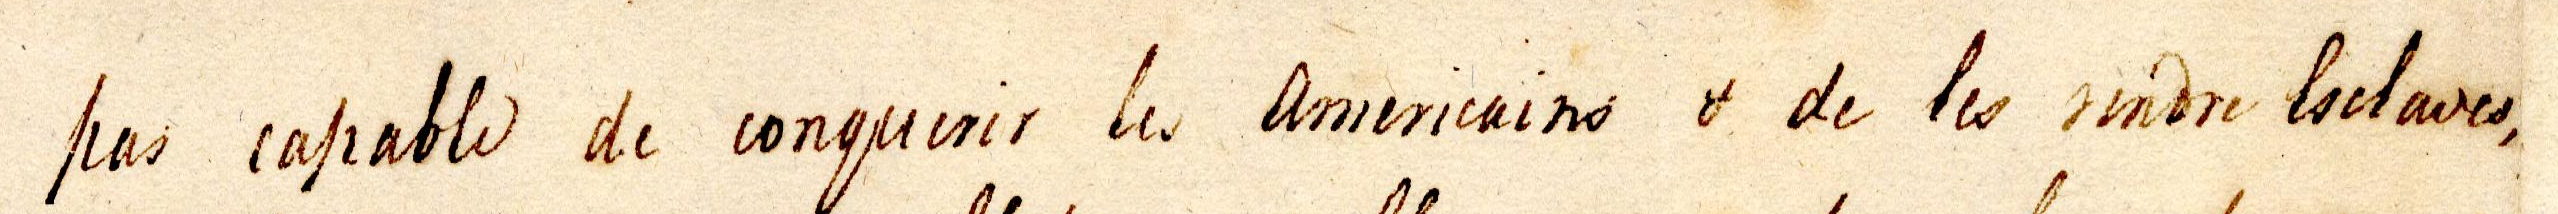pas capable de conquerir les Americains & de les rendre Esclaves
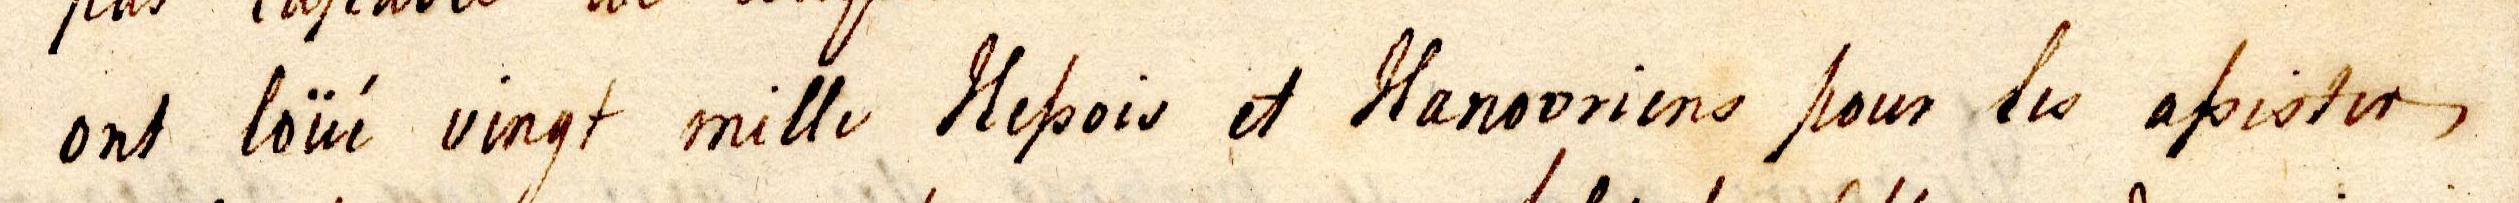ont loüé vingt mille Hessois et Hanovriens pour les assister
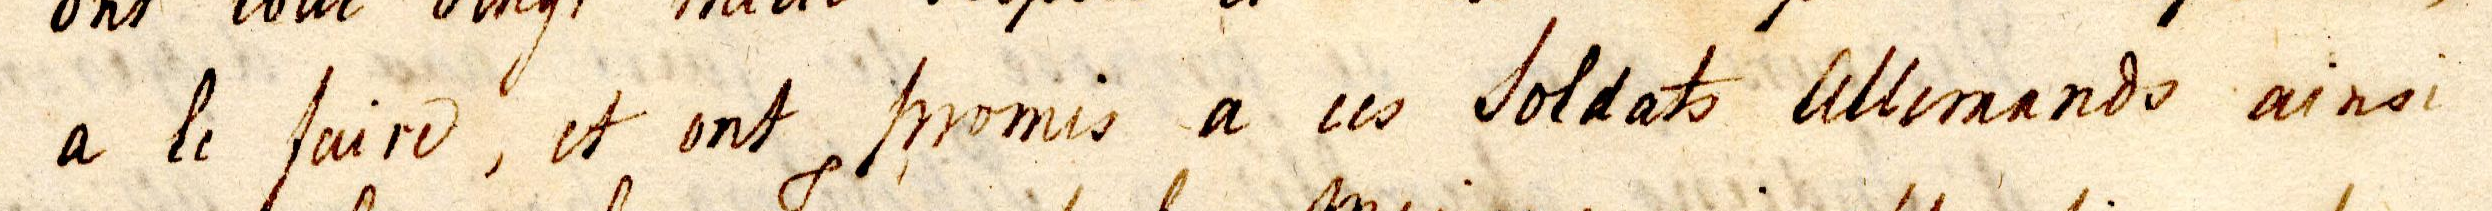a le faire, et ont promis a ces Soldats Allemands ainsi
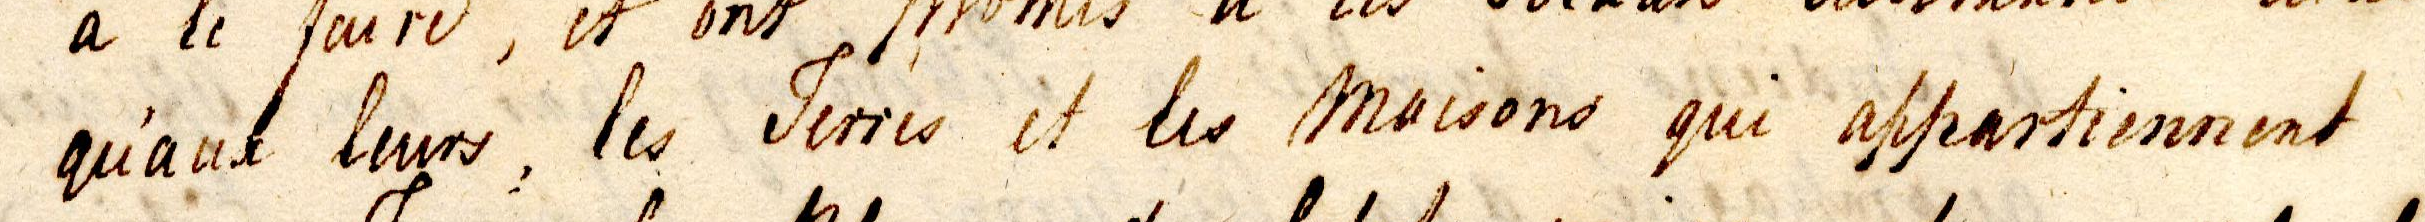qu'aux leurs, les Terres et les Maisons qui appartiennet
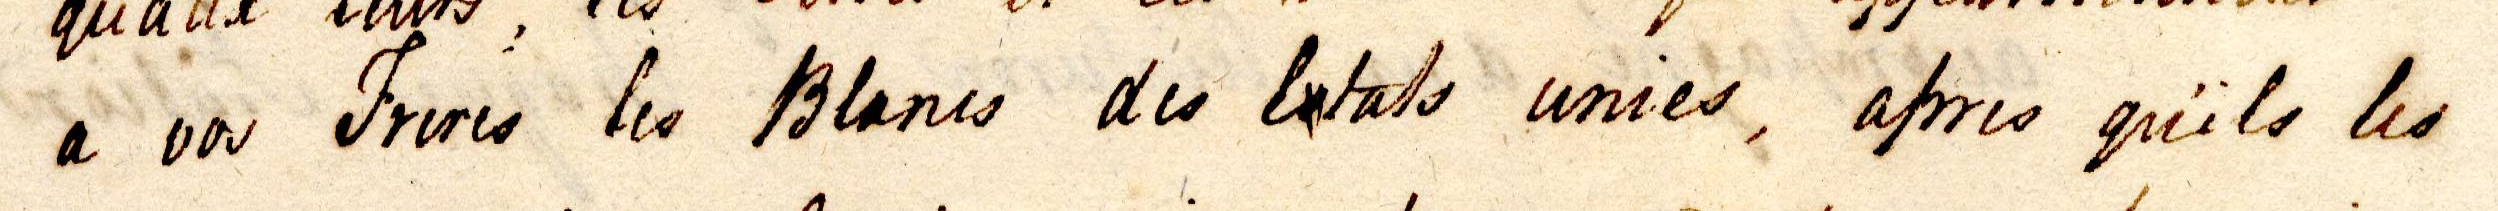a vos Freres les Blancs des Estates unies, apres qu'ils les
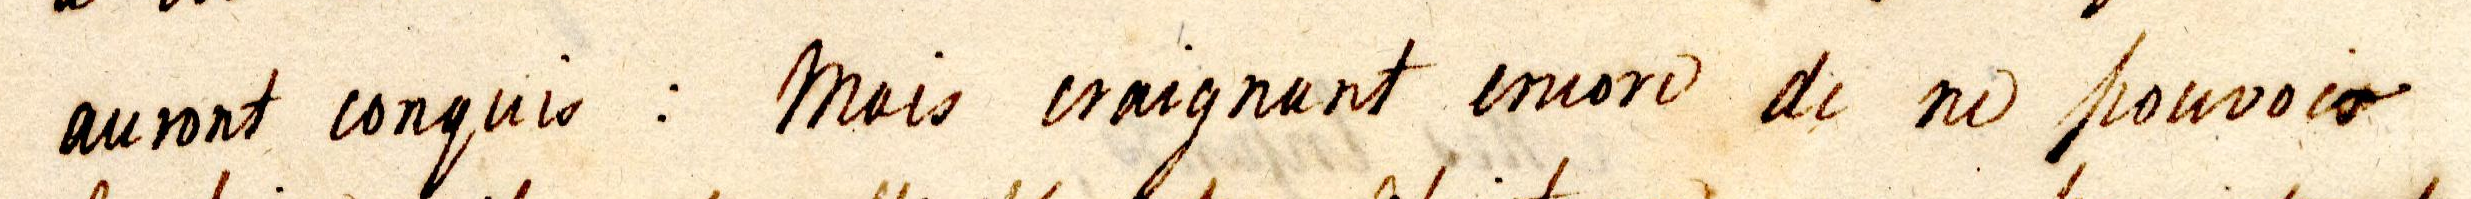auront conquis: Mais craignant encore de ne pouvoir
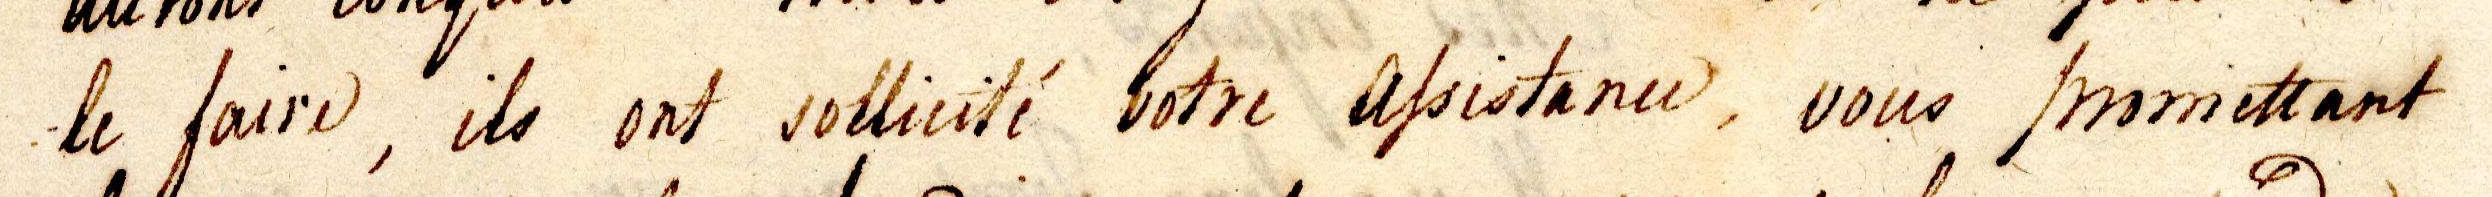le faire, ils ont sollicité votre Assistance, vous promettant
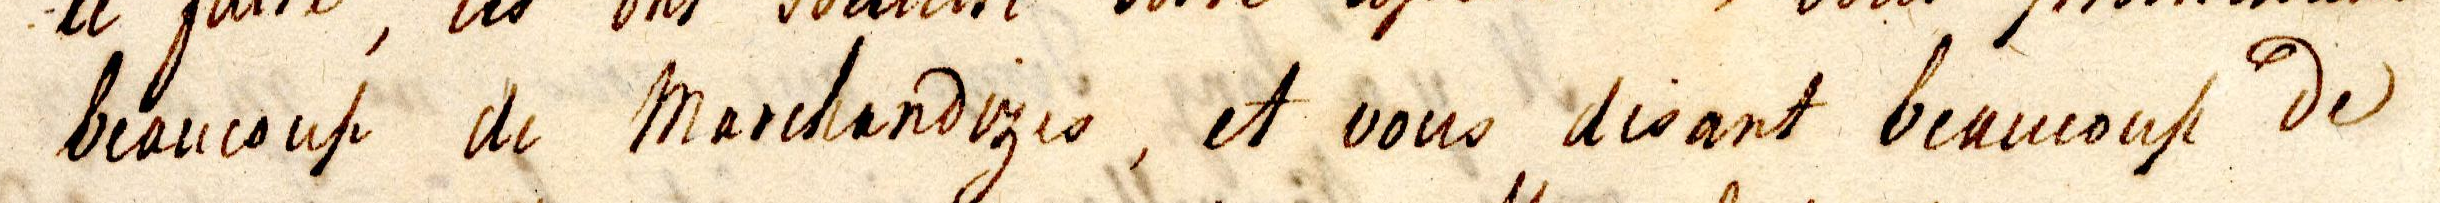beaucoup de Marchandizes, et vous disant beaucoup de
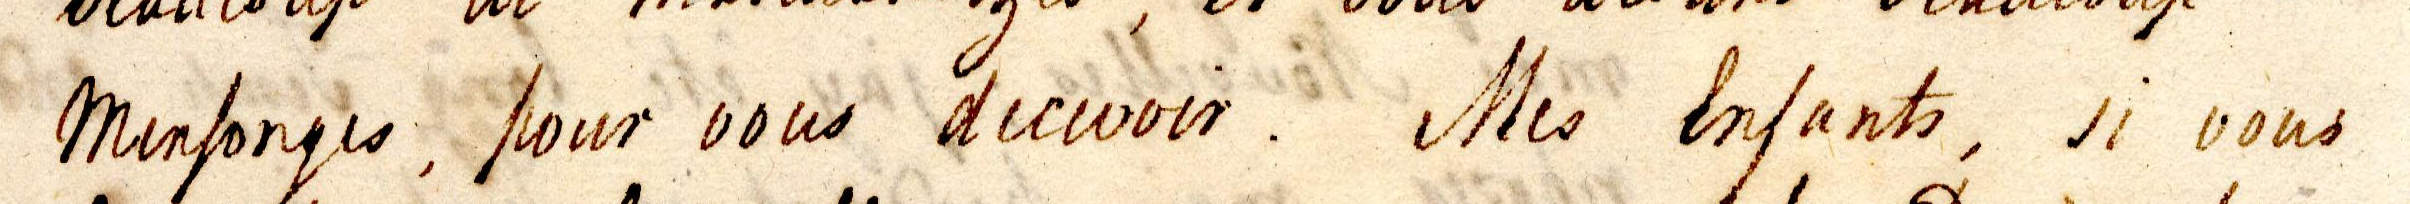Mensonges, pour vous decevoir. Mes enfants, si vous
